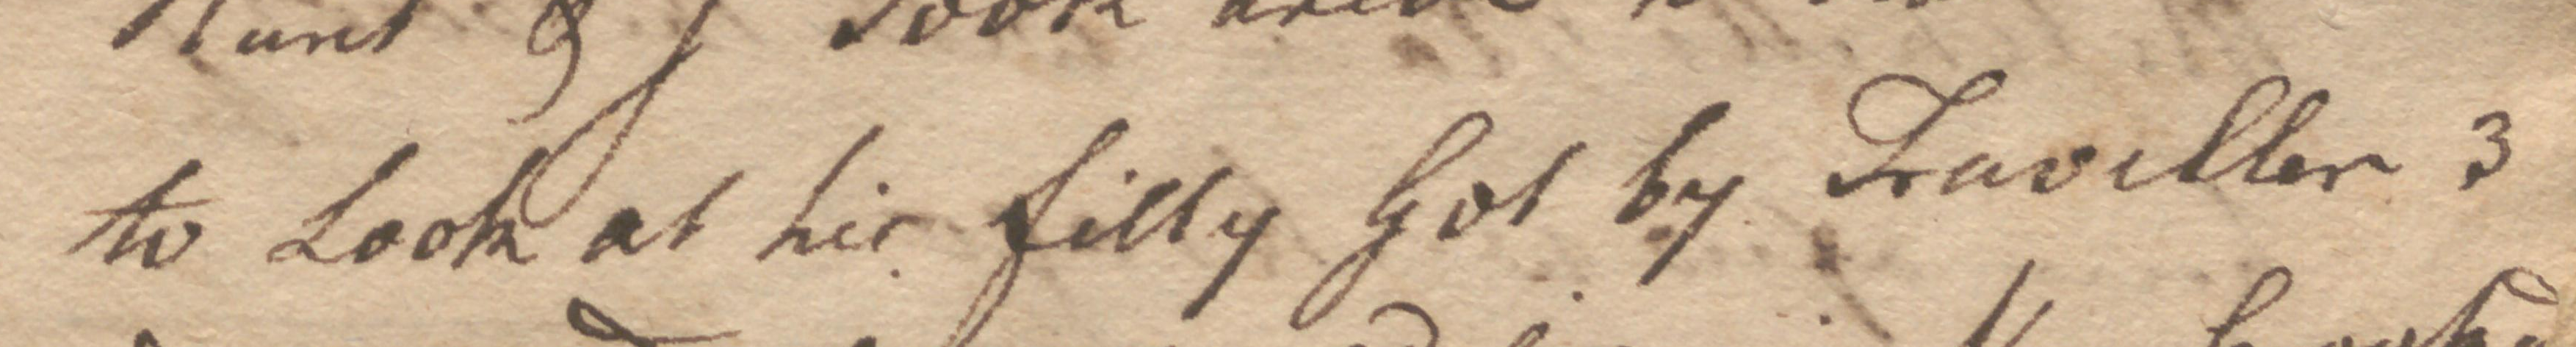to Look at his filly Got by Faveller 3
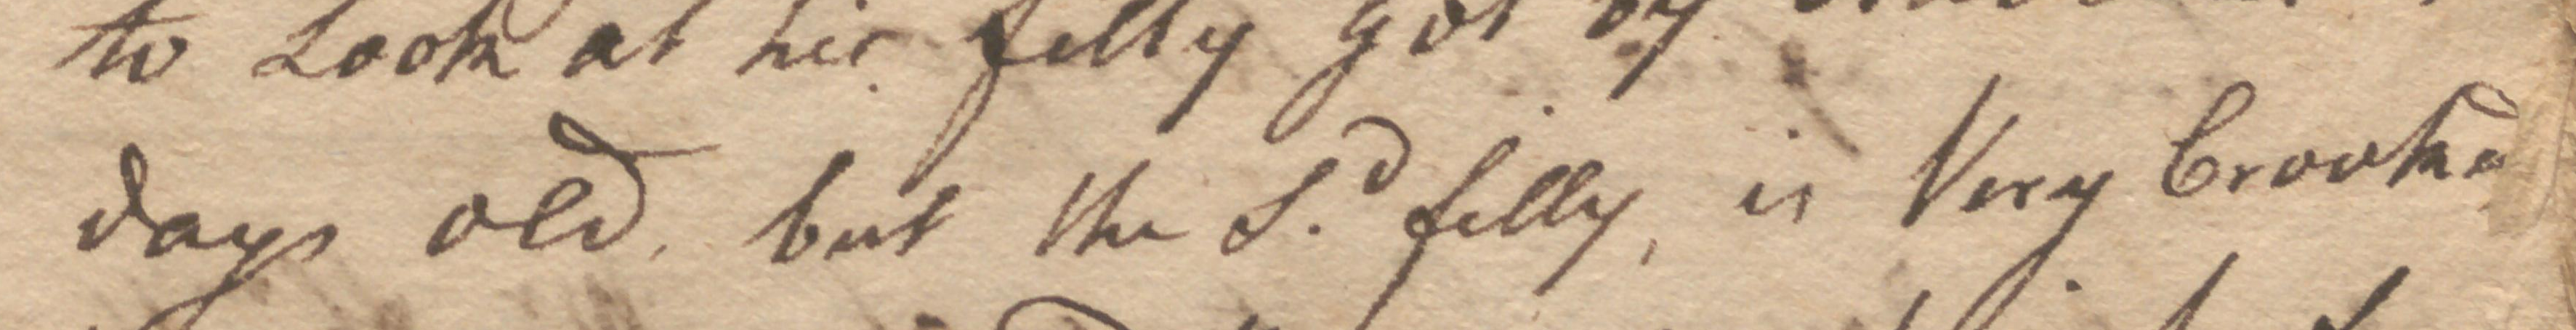days old, but the s^d. filly, is Very Crooked
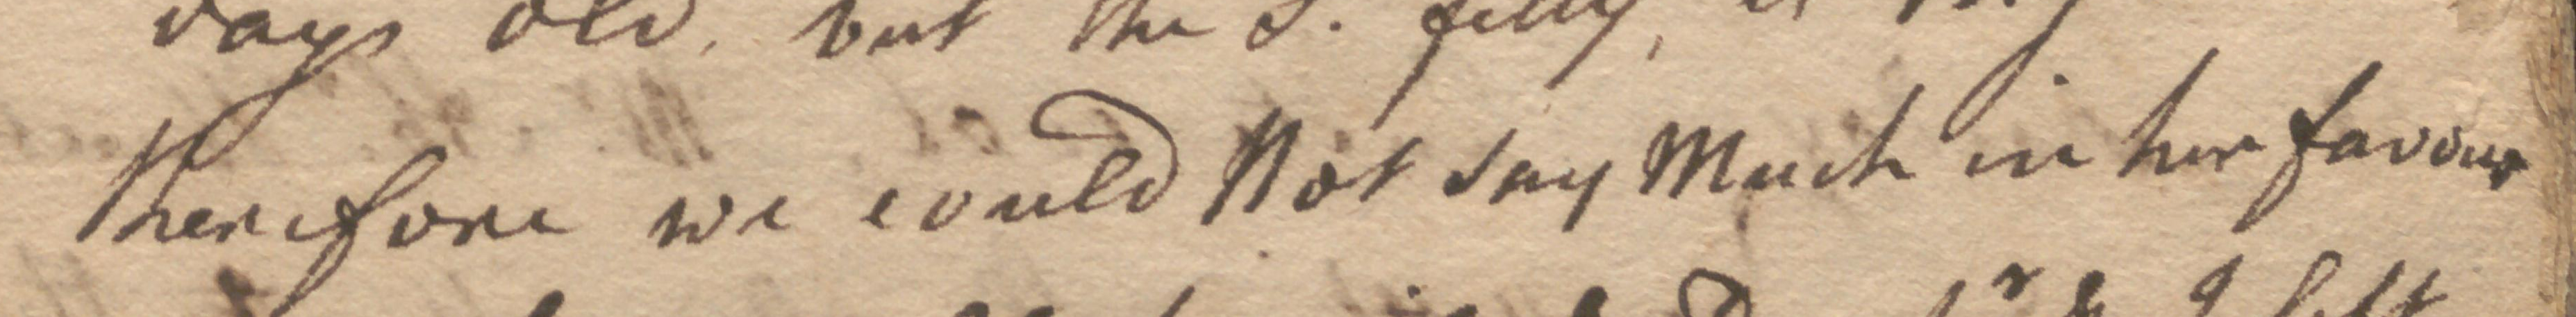therefore we could Not say Much in her favour
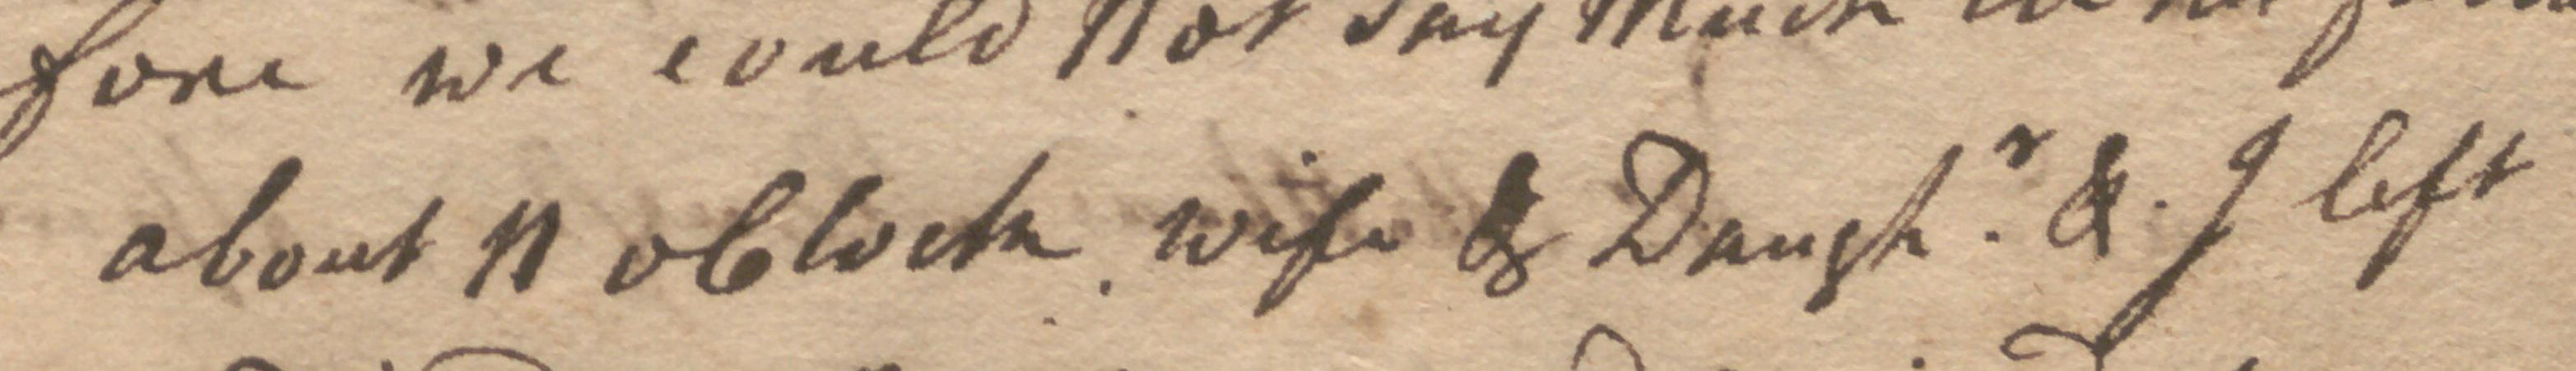about 11 oClock, wife & Daugh^r. &. I left
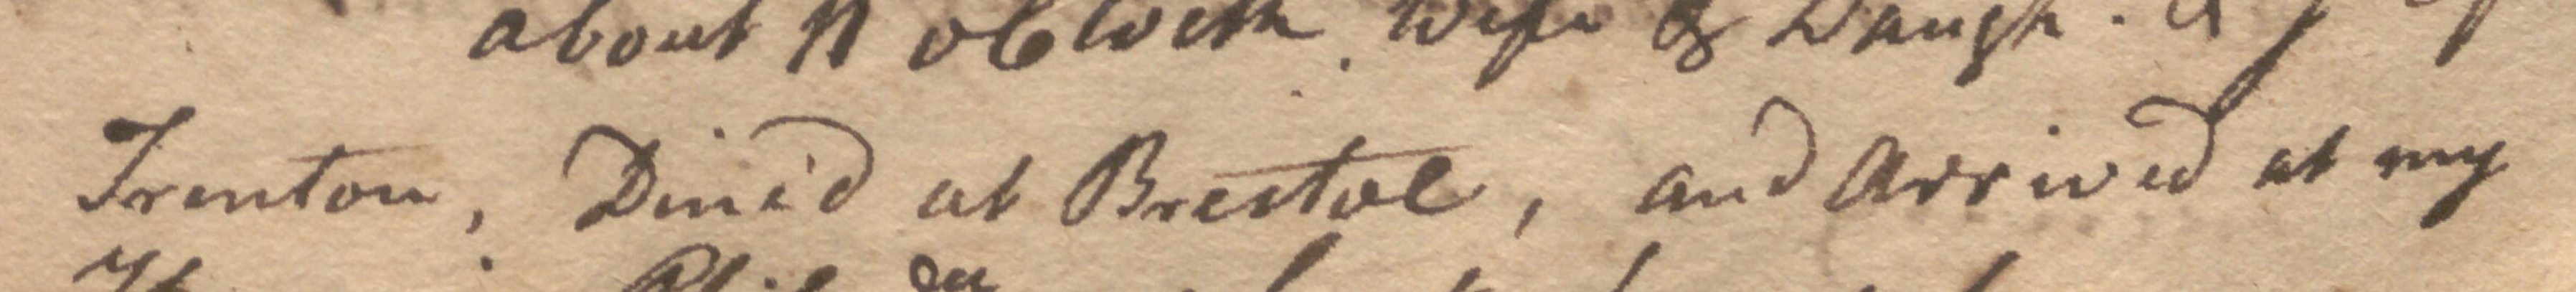Trenton, Dine'd at Bristol, and arrived at my
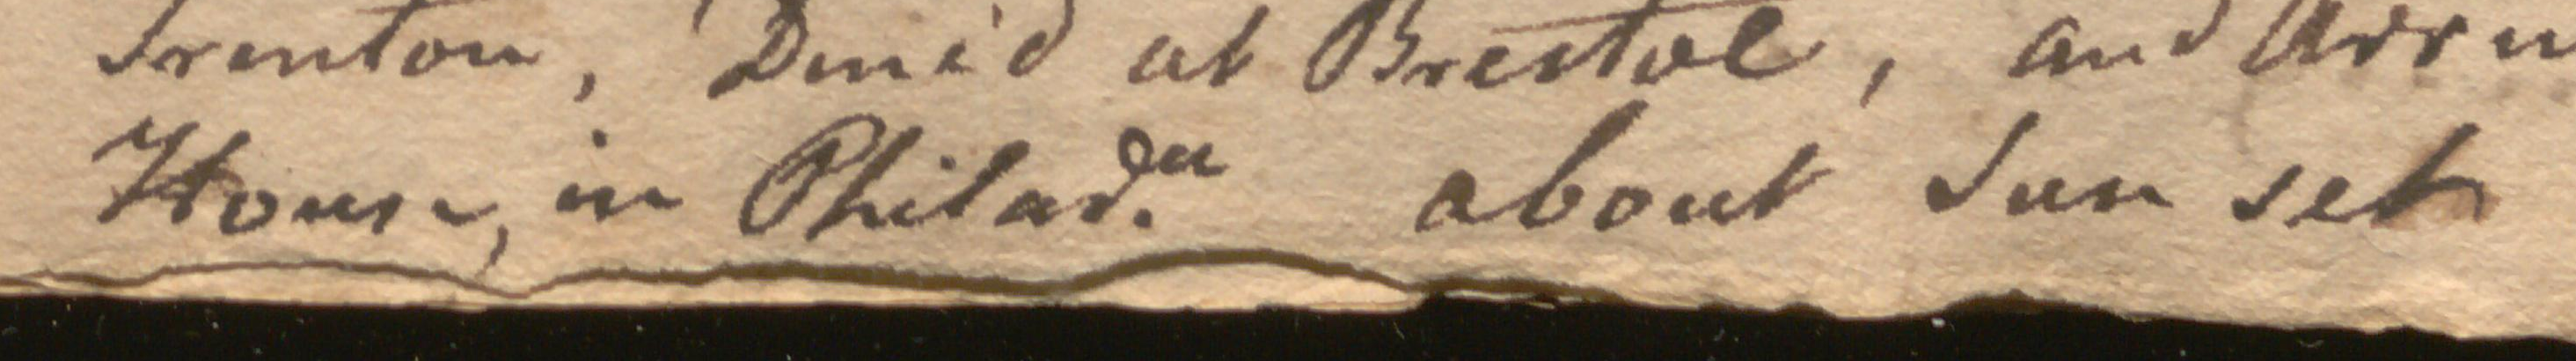House, in Philad^a. about Sun set
